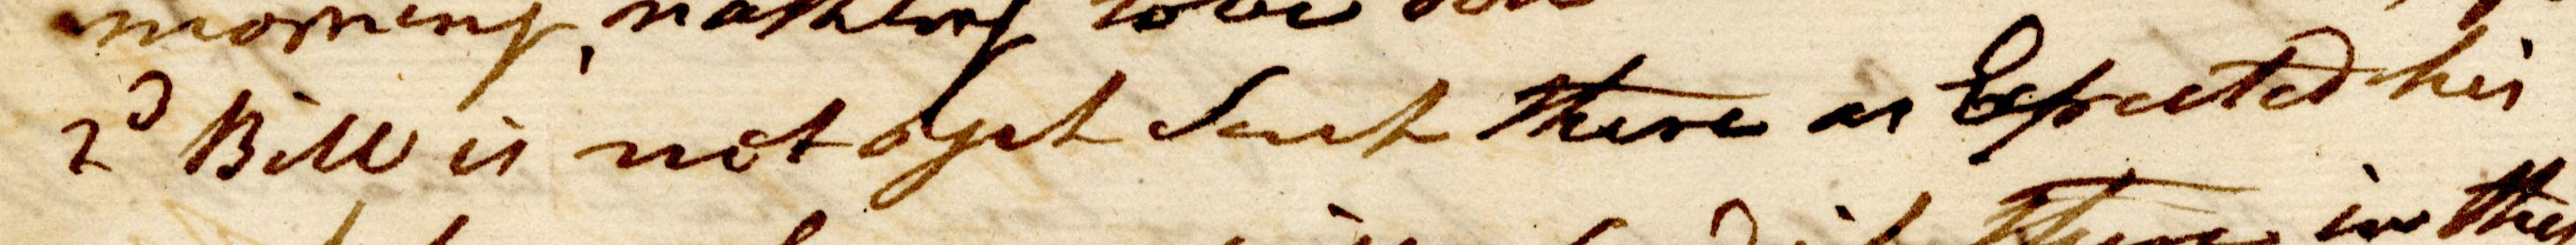2d Bill is not yet Sent there as expected his
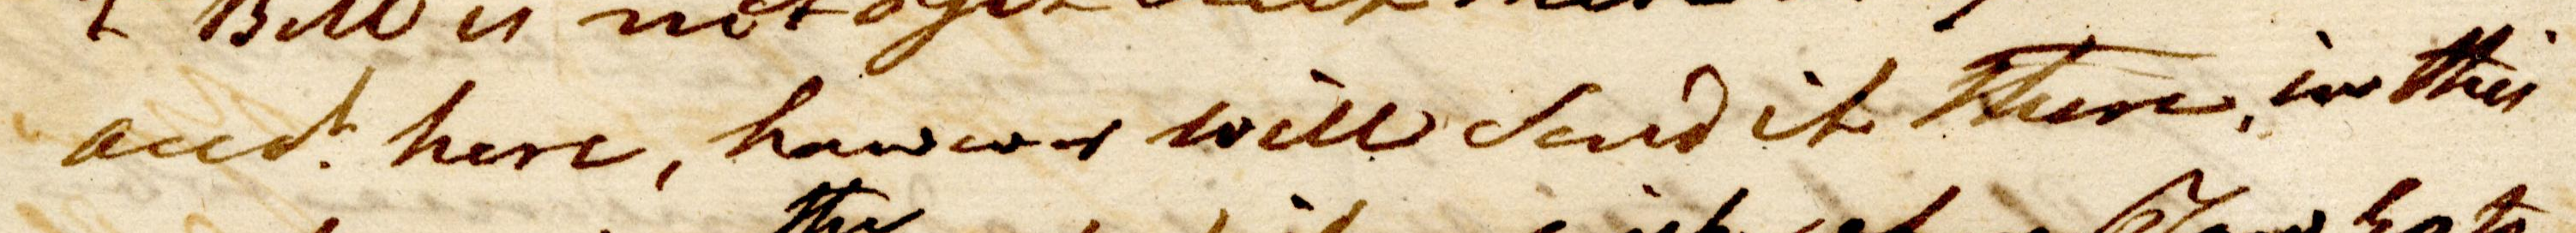acco^t here, however will send it there, in this
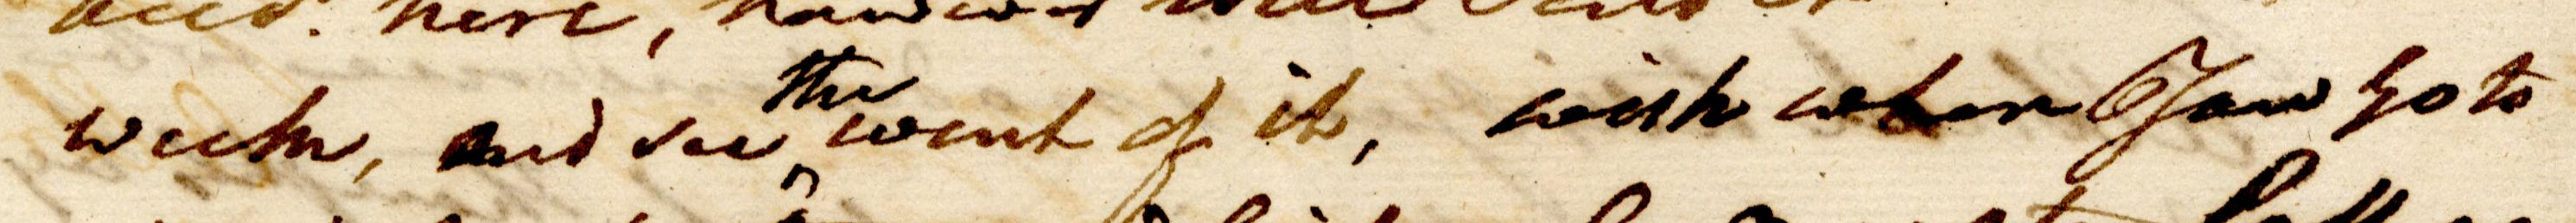week, and see ^the event of it, which when you go to
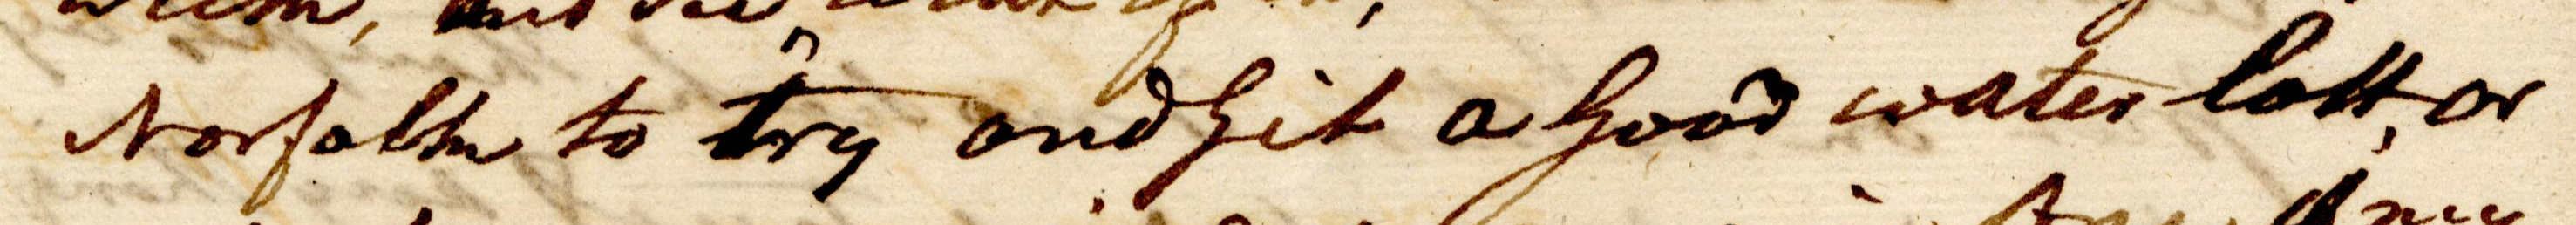Norfolk to try and git a Good water lott or
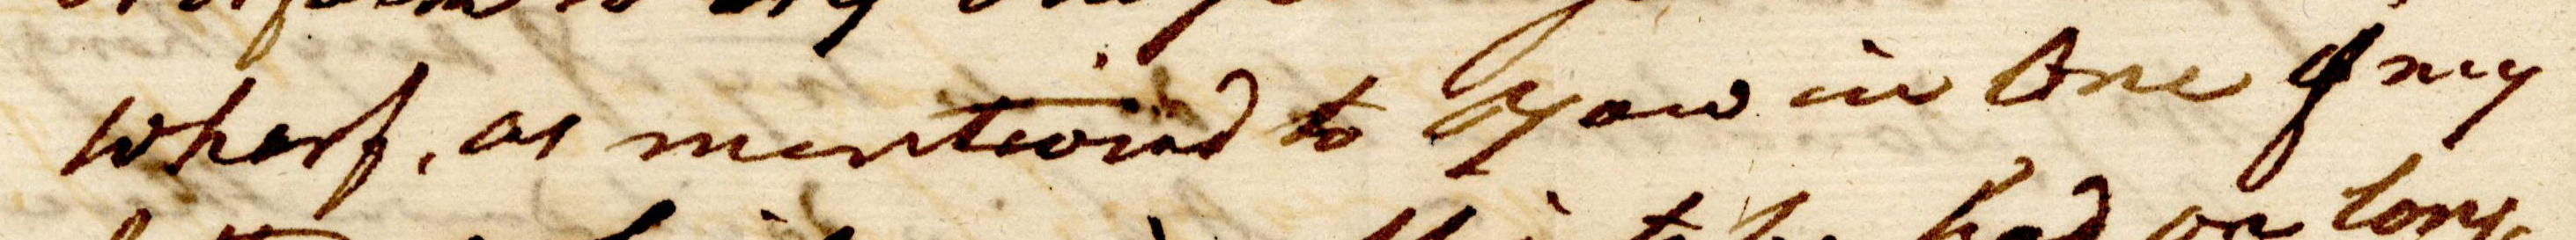wharf as mentiond to you in one of my
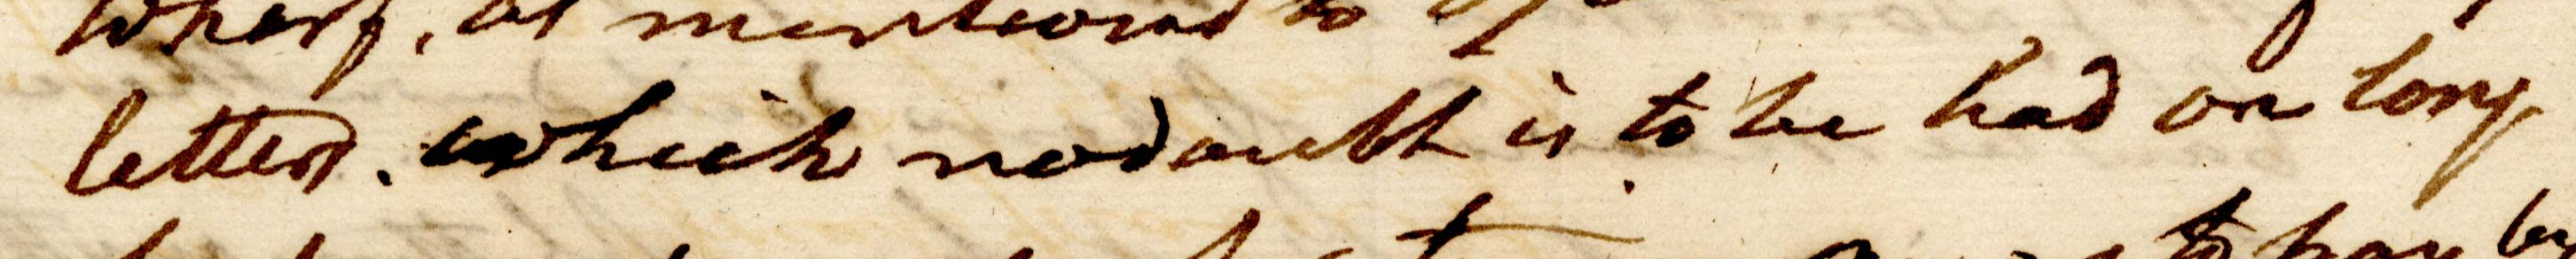letters which no doubt is to be had on long
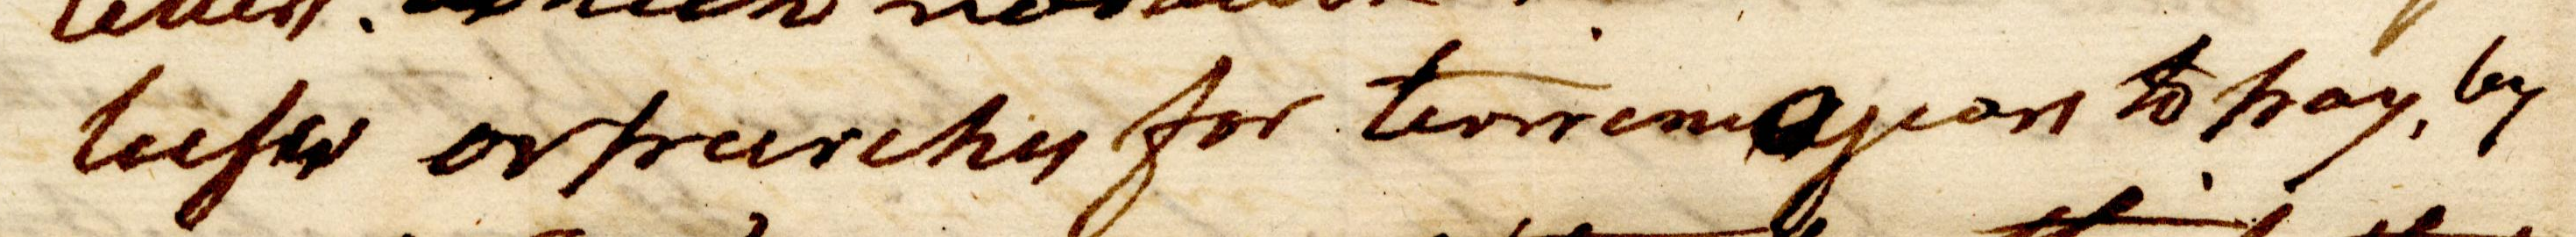leesse or purchas for turning yours to pay, by
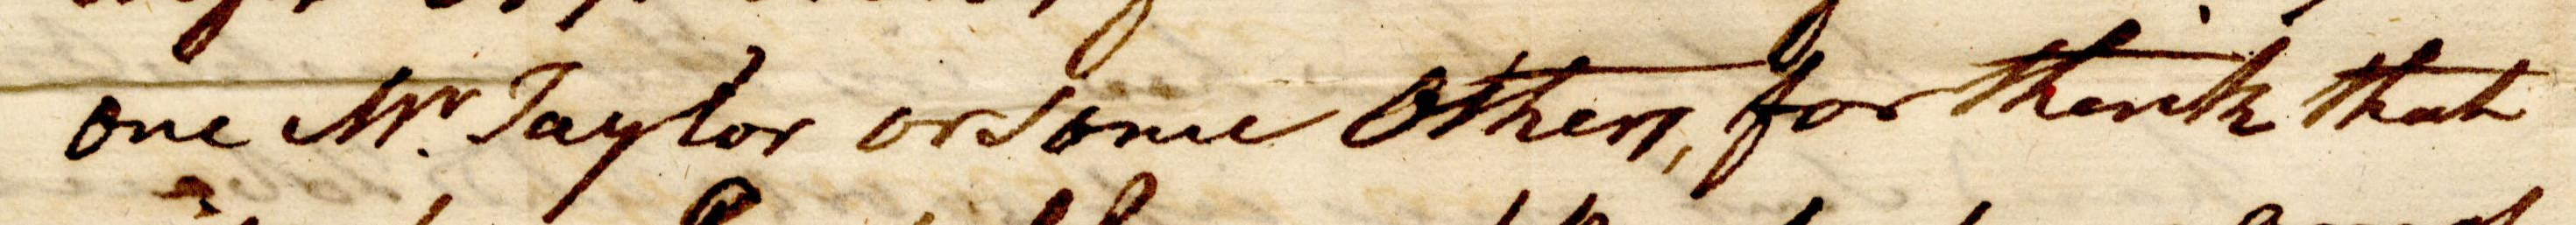one M^r. Taylor or Some Others, for think that
